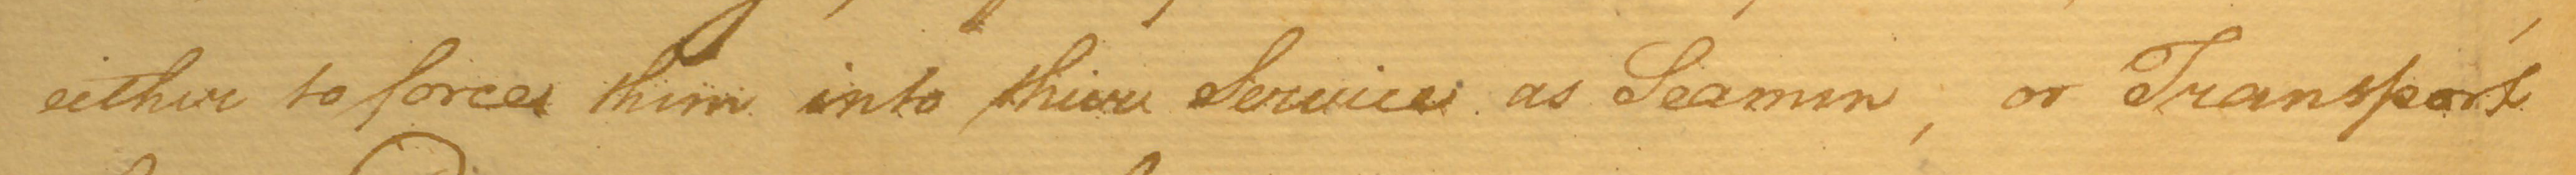either to force them into their Services as Seamen, or Transport
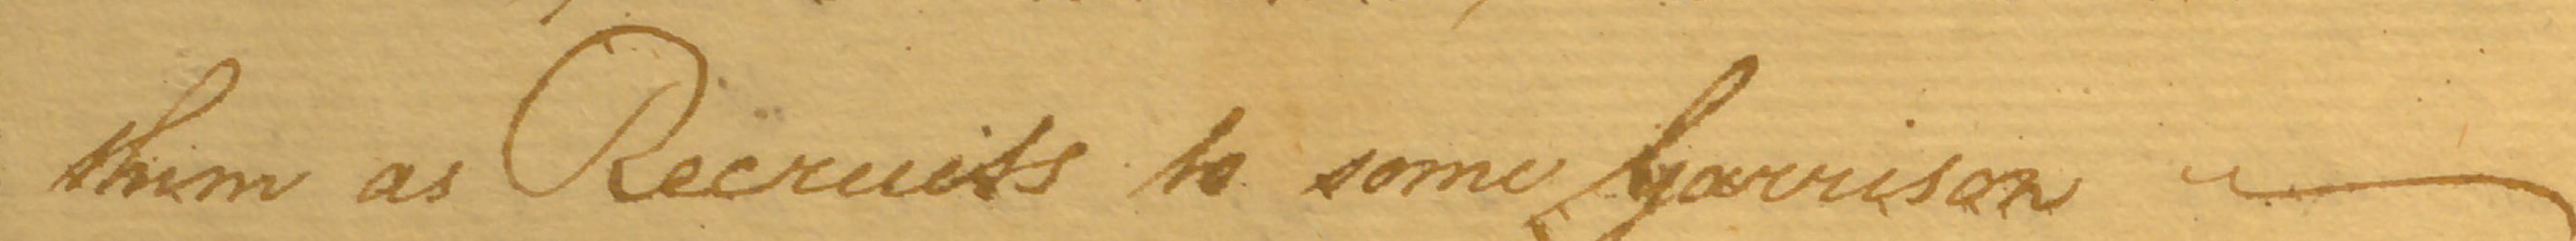them as Recruits to some Garrison-
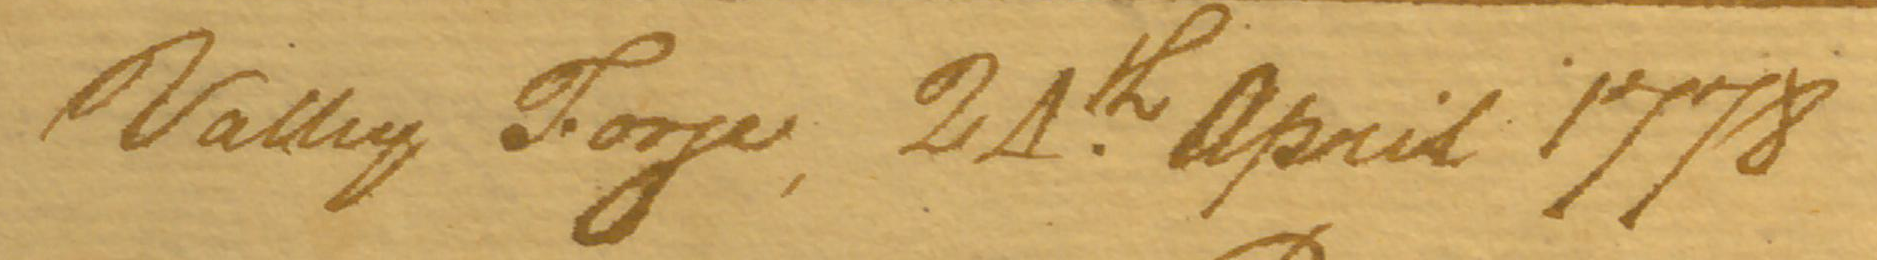Valley Forge, 24^th. April 1778
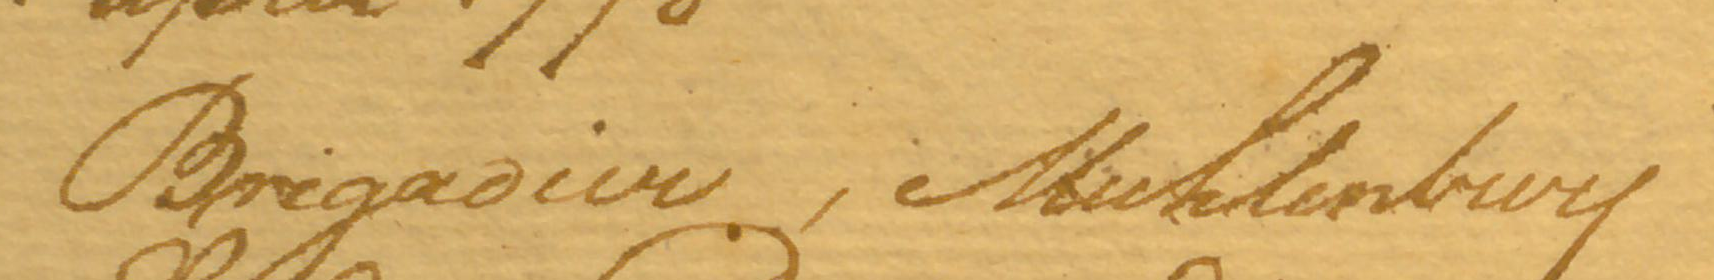Brigadier Muhlenburg
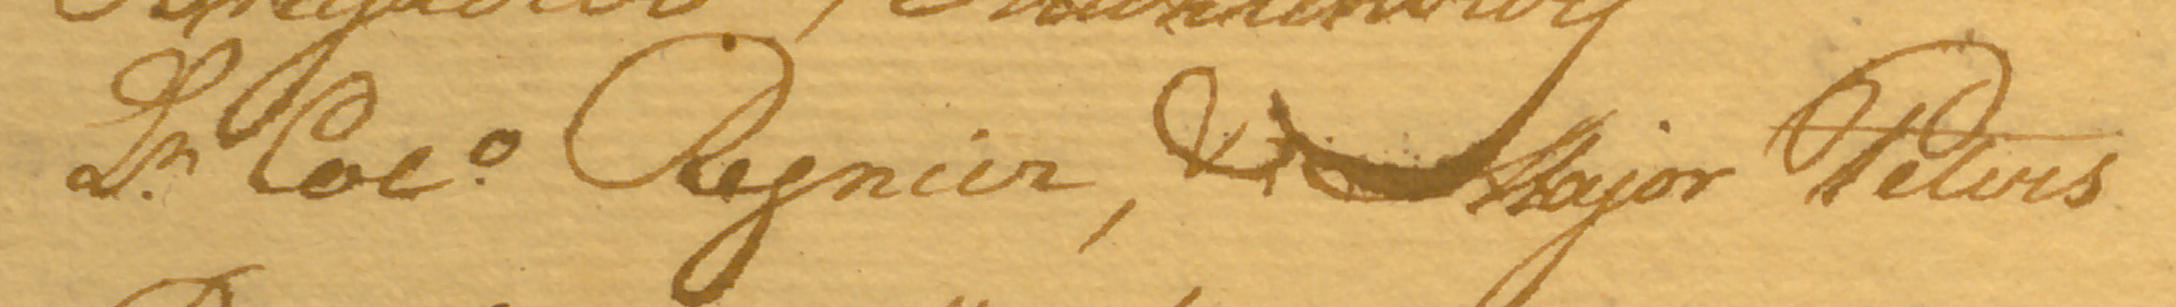L^t. Col^o. Regnier, Major Peters
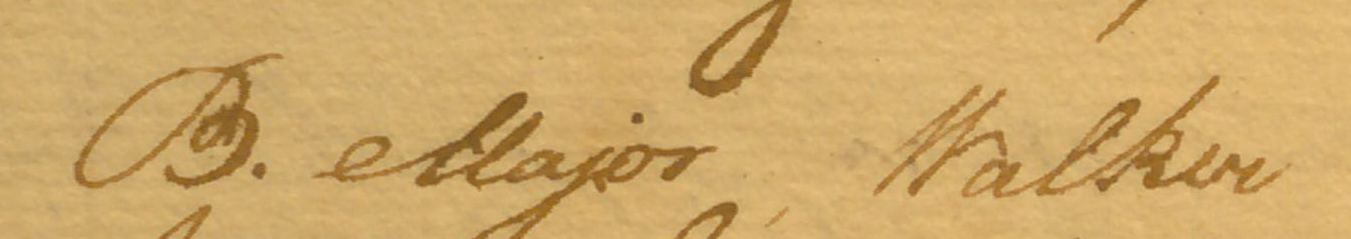B. Major Walker
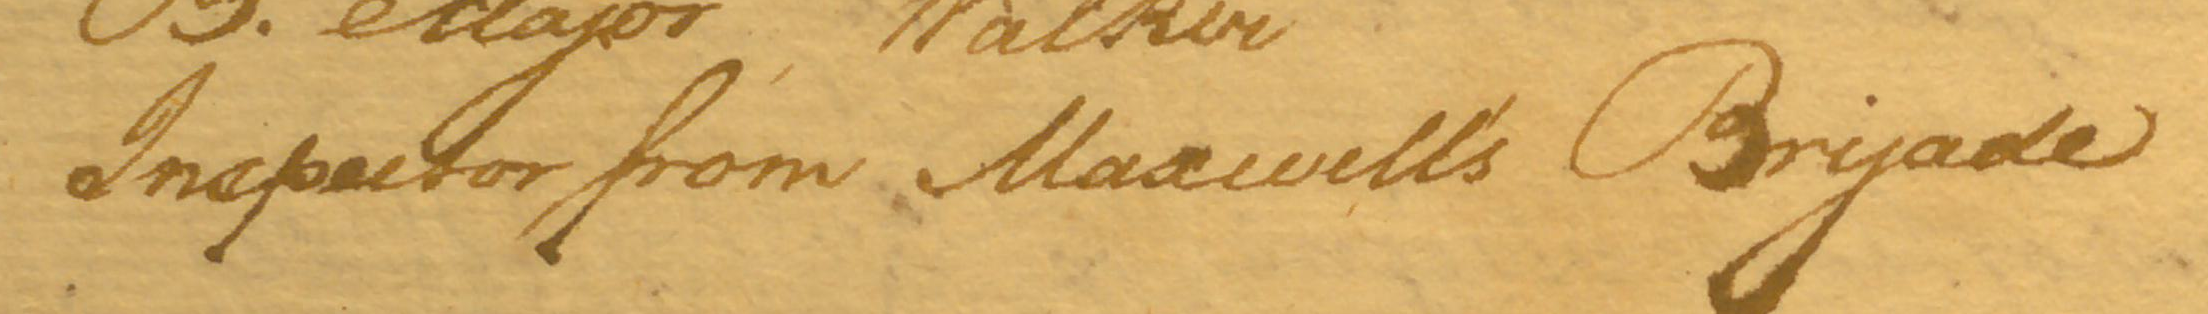Inspector from Maxwell's Brigade
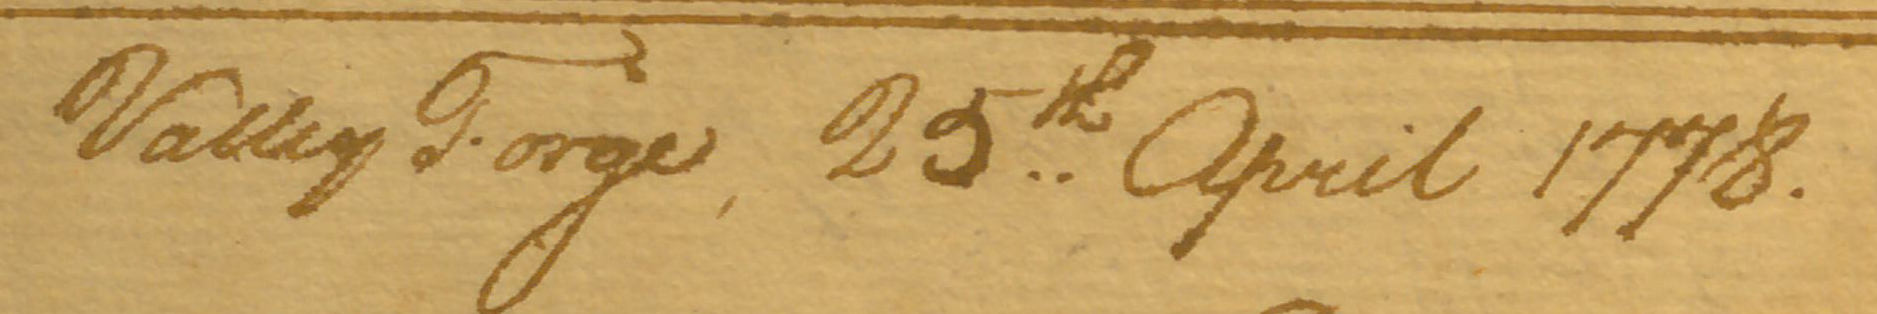Valley Forge, 25^th. April 1778.
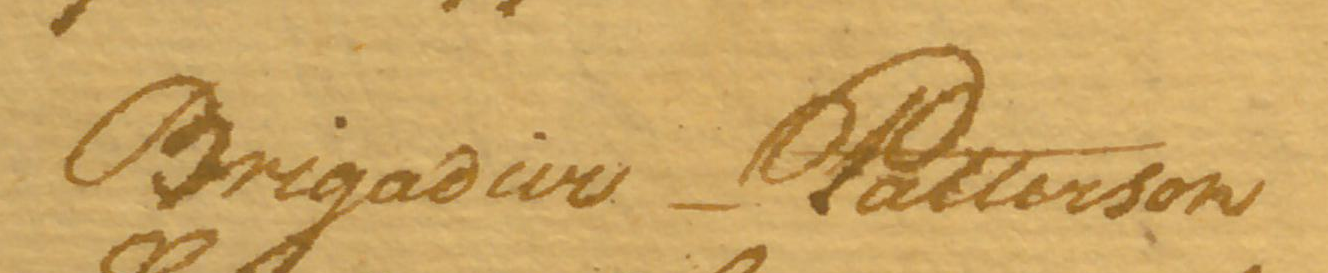Brigadier- Patterson
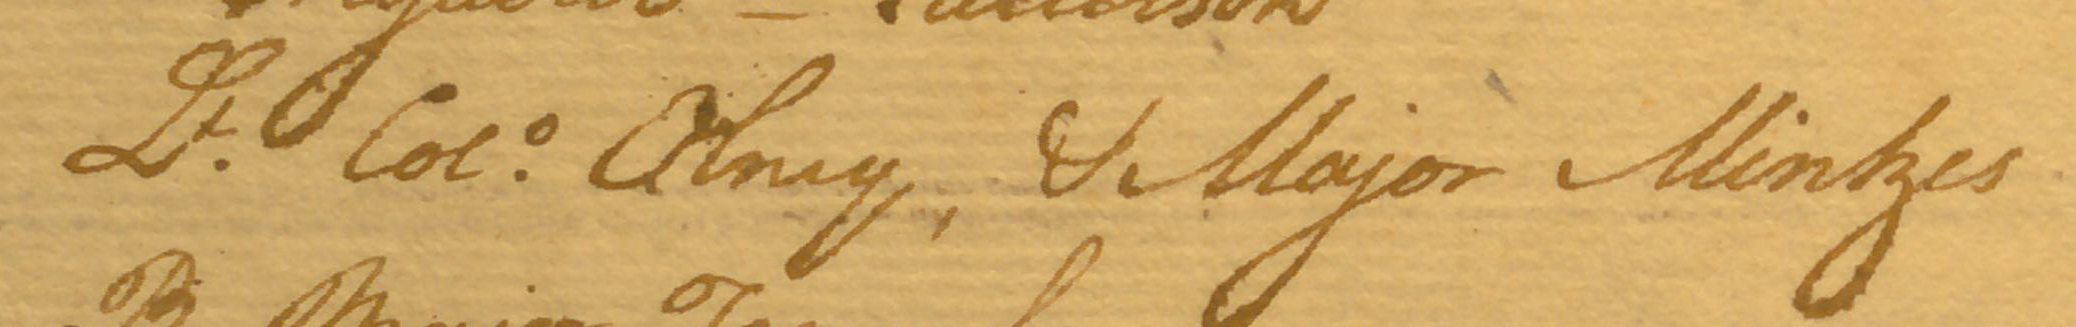L^t. Col^o. Olney, & Major Mintzes
